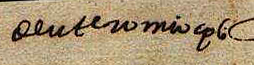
deuteromio cp 6
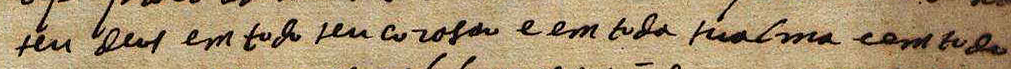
teu Deus em todo seu corasao e em toda tu alma e em todo
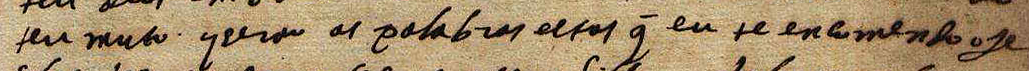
teu muto. y seran as palabras estas q̄ eu te encomendo oJe
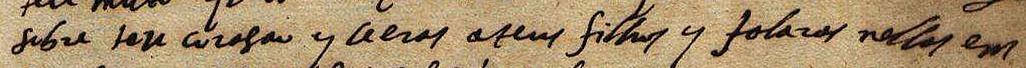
sobre teu corasao y leeras a teus filhos y falaras nellas em
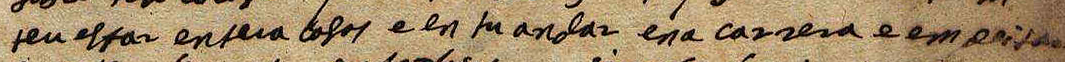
teu altar en tua casas e en tu andar e na carrera e em deitar
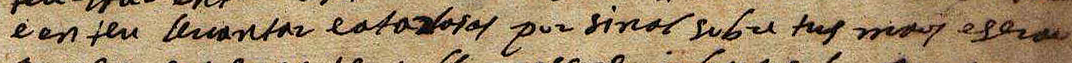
e en teu leuantar e atadolas por sinal sobre tus maos e seran
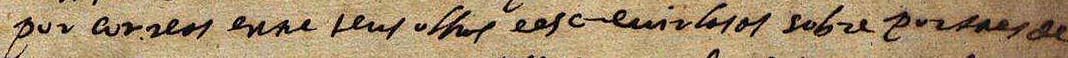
por correas entre teus olhos e escreuirlasas sobre portaes de
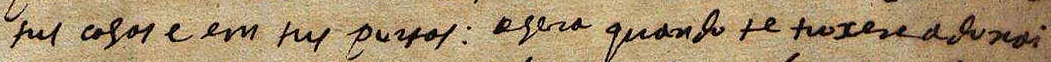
tus casas e em tus portas: e sera quando te troxere adonai
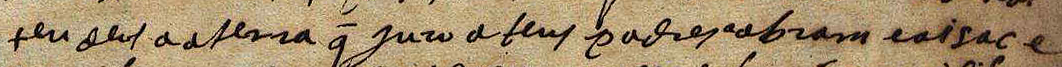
teu deos aa terra q̄ juro a teus padres a abram e a isac e
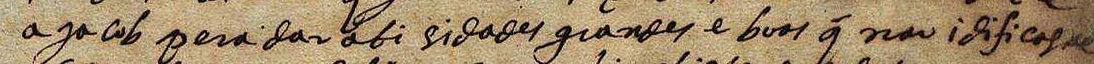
a jacob pera dar a ti sidades grandes e boas q̄ nao idificaste
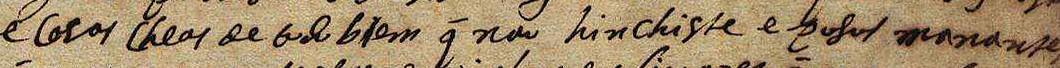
e casas cheas de todo biem q̄ naõ hinchiste e posos manante
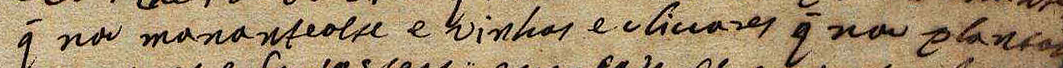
q̄ nao mananteaste e vinhas e oliuares q̄ nao plantas
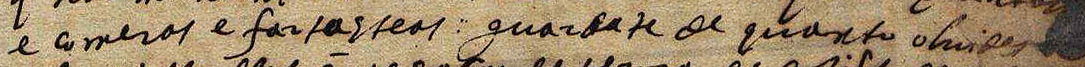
e comeras e fartasteas: guardate de quanto oluides
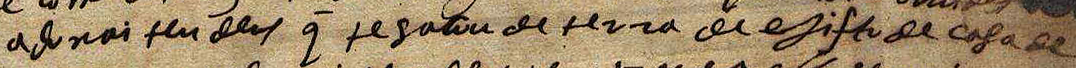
adonai teu deos q̄ te sacou de terra de ejifto de casa de
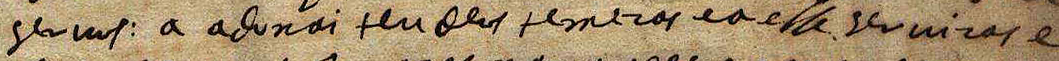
seruos: a adonai teu deos temeras e a elle seruiras e
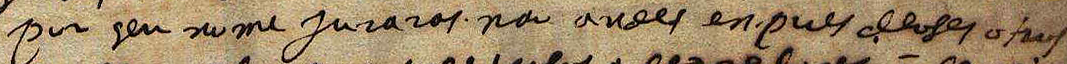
por seu nome Juraras nao andes en pues deoses otros
